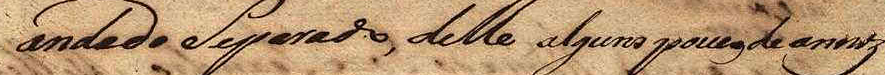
andado Separado, delle alguns poucos de annoz
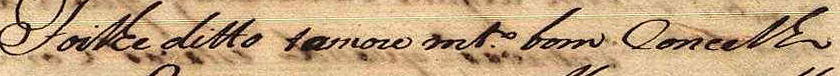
Foilhe ditto tomou mt.o bom Concelho
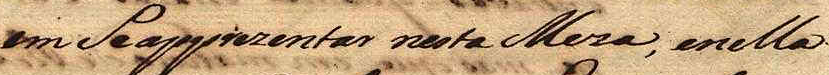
em Se apprezentar nesta Meza, e nella
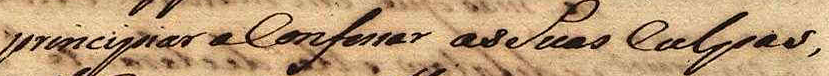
principiar a Confessar as Suas Culpas,
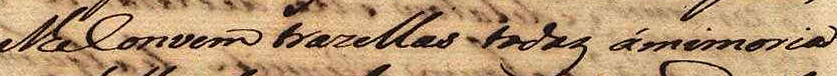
lhe Convem trazellas todaz á mimoria
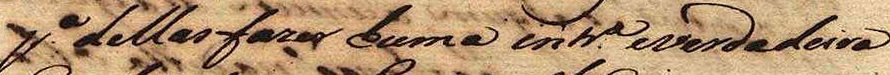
p.a dellas fazer huma intr.a e verdadeira
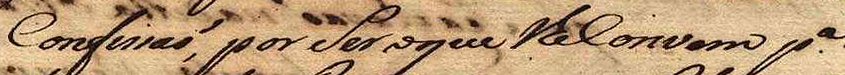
Confissaõ, por Ser o que lhe Convem p.a
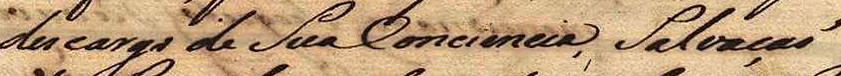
descargo de Sua Conciencia, Salvaçaõ
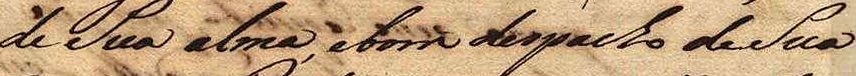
de Sua alma, e bom despacho de Sua
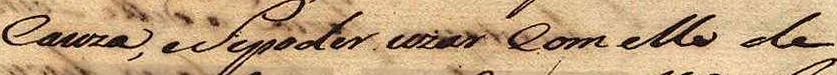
Cauza, e Se poder uzar Com elle de
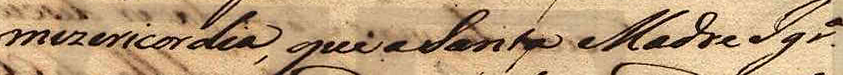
mezericordia, que a Santa Madre Igr.a
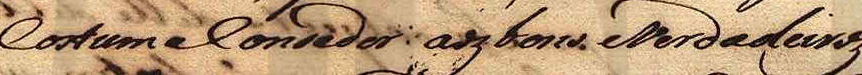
Costuma Conseder aoz bons e verdadeiroz
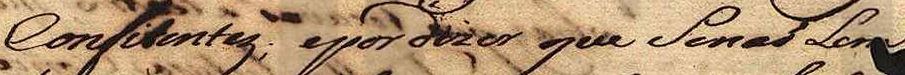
Confitentez; e por dizer que Se naõ Lem
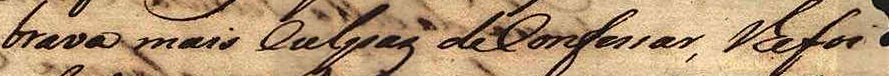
brava mais Culpaz de Confessar, lhe foi
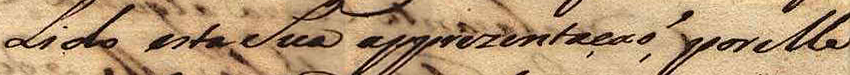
Lido esta Sua apprezentaçaõ, por elle
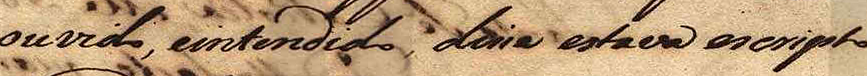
ouvido, e intendido, disse estava escripto
